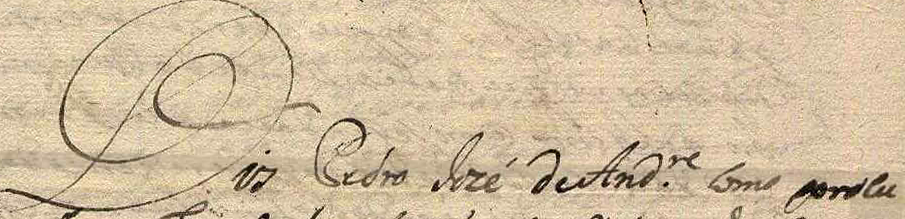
Dis Pedro Iozé de And.re Como porcu
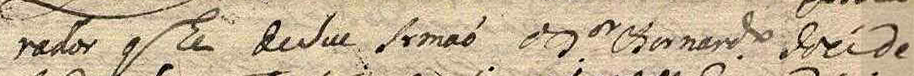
rador q he de seu Irmaõ o s.or Bernard.o Iozé de
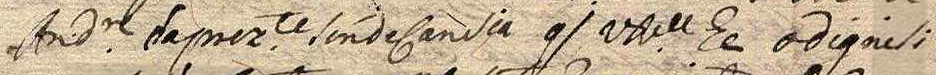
And.re da prez.te sendeCansia q VM.ce he o dignisi
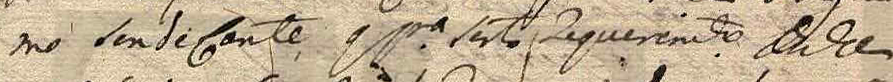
mo sendiCante, q p.ra serto Requerem.to Ou he
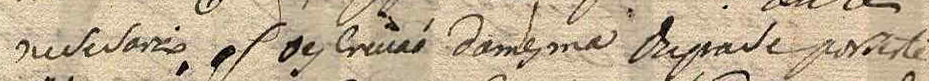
nesesario, q̄ o esCriuaõ da mesma lhe pase por sesti
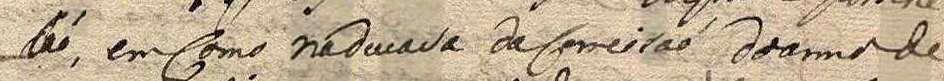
daõ, em Como na deuasa da Comeisaõ do anno de
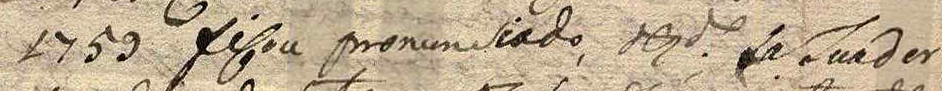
1759 fiCou pronunciado o Rd.o saLuador
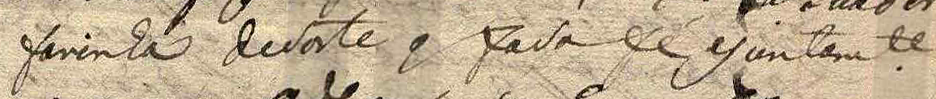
farinha de sorte q fasa fée juntam.te
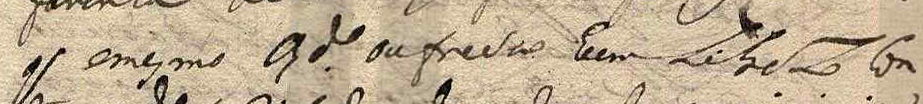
q o mesmo Rd.o oufresao hum LibeLo Con
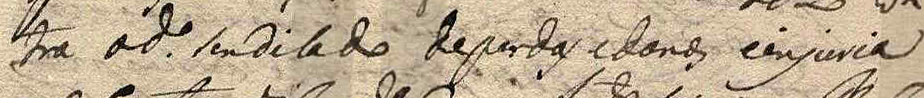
tra o d.o sendiCado de perdas e danos e injuria
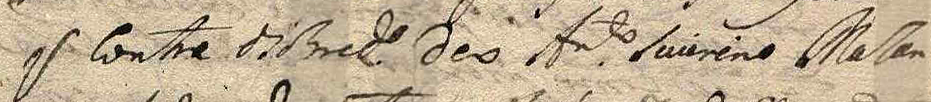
q̄ Contra o sobred.o Reo An.to Seuirino Malan
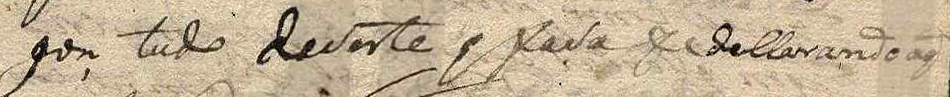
gon, tudo da sorte q fasa fe declarando o q
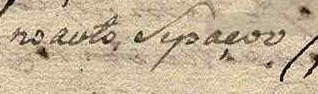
no auto se paçou
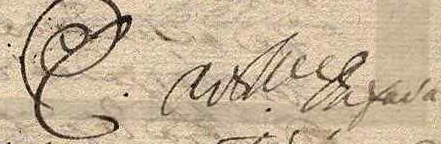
P. a v M.ce Refasa
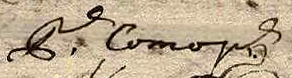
P.e Com o pr.o
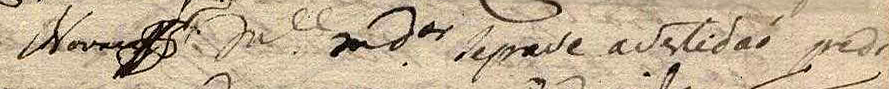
Novaes m.ce md.os se pase a sertidaõ pedi
